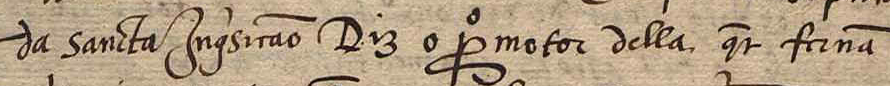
da sancta Jnq̄sicão Diz o ꝓomotor della ꝯ̄t fernā
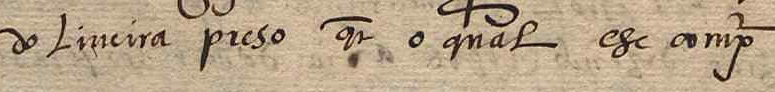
doLiueira preso ꝯ̄t o qual lhe compr
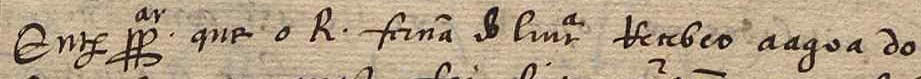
Entꝭ ꝓꝑar. que o R. fernā doliura Reçebeo a agoa do
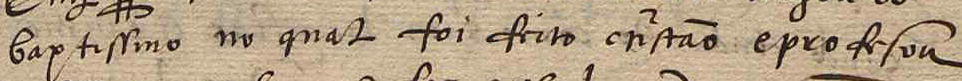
baptismo no qual foi feito cristão e profesou
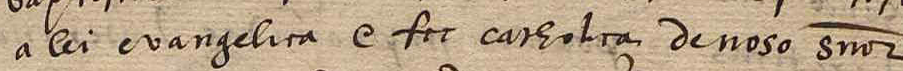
a lei evangelica e fee catholica de noso s̄nor
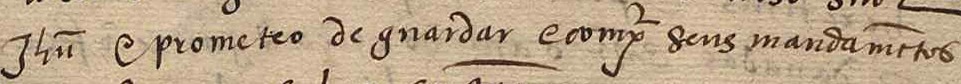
Jhū e prometeo de guardar e compr seus mandamētos
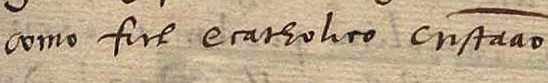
como fiel e catholico cristaão
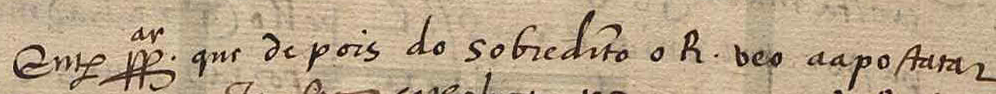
Entꝭ ꝓꝓar. que depois do sobredito o R. veo a apostatar
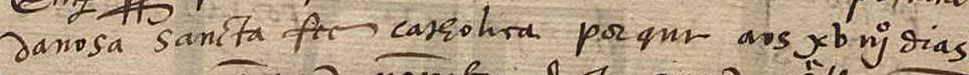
da nosa sancta fee catholica porque aos xviijo dias
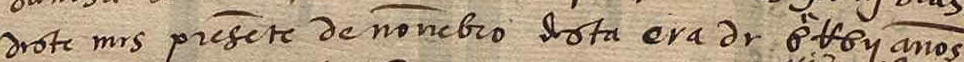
deste mes presēte de n̄ouebro desta era de bcRbij ānos
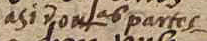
asi ē outas partes
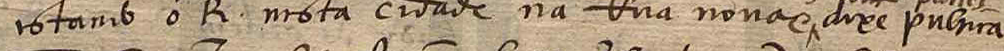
estando o R. nesta cidade na Rua noua e dixe pubrica
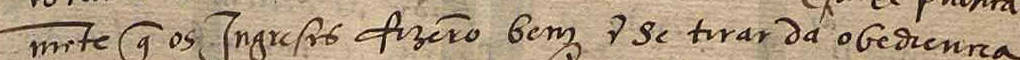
mete q̄ os Jngreses fizer̄o bem ē se tirar da obediencia
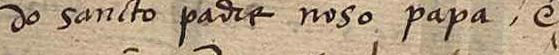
do sancto padre noso papa, e
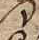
ē
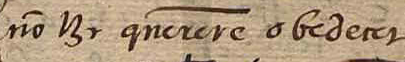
nō lhe qūerere obedecer
